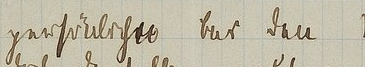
persönlich bei den
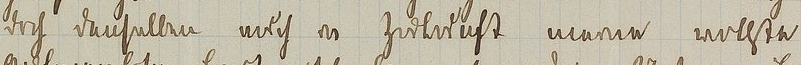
doch denselben auch in Zukunft meine vollste
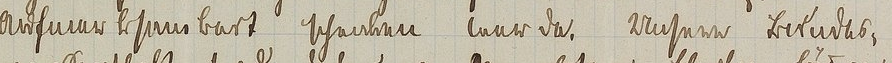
Aufmerksamkeit schenken werde. Unsere Bundes-
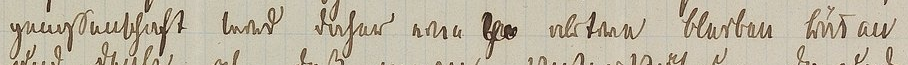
genossenschaft wird daher eine ... aktive bleiben können
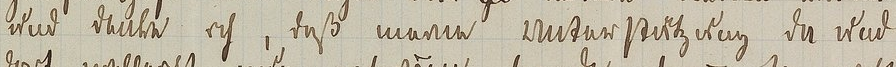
und denke ich, daß meine Unterstützung da und
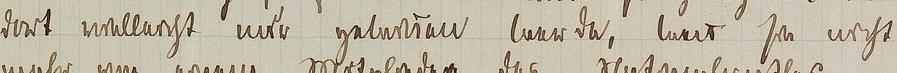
dort vielleicht nur gewinnen werde, wenn sie nicht
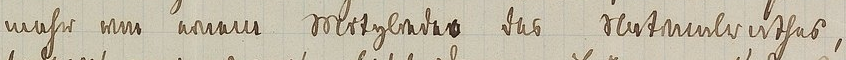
mehr von einem Mitgliede des Nationalrathes,
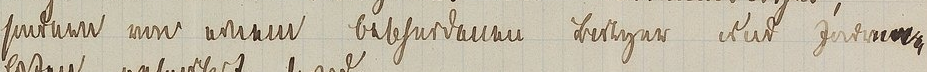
sondern von einem bescheidenen Bürger und Journa-
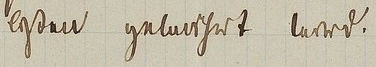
listen gewährt wird.
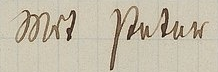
Mit steter
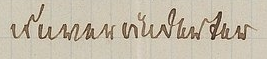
unveränderter
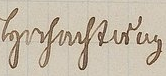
Hochachtung
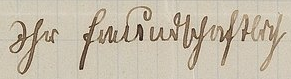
Ihr freundschaftlich
